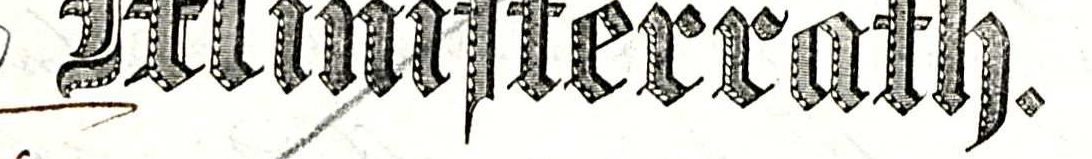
Ministerrath.
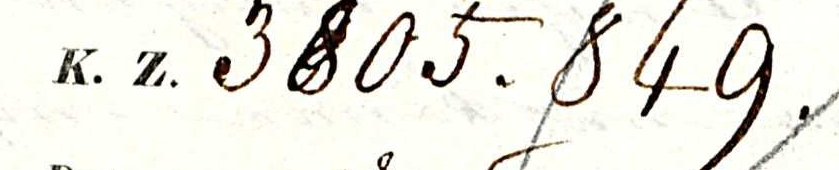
K. Z. 3805. 849.
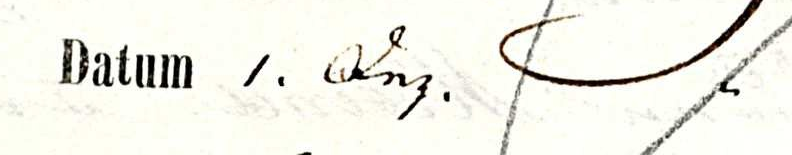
Datum 1. Dez. 849
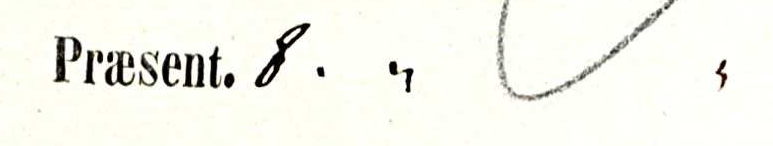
Præsent. 8. Dez. 849
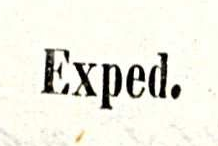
Exped.
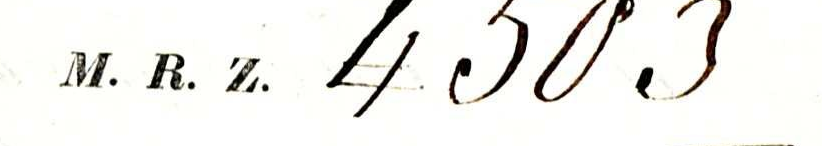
M. R. Z. 4503
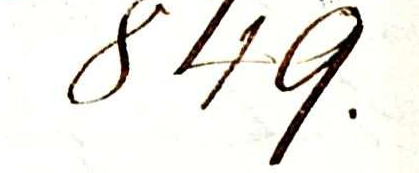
849
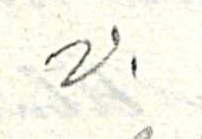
V.
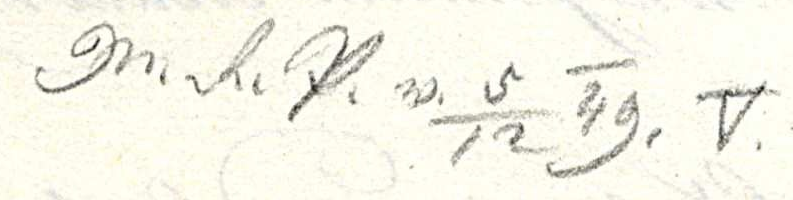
M. R. P. v. 5/12 49. V.
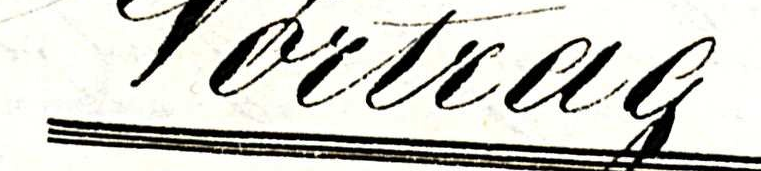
Vortrag
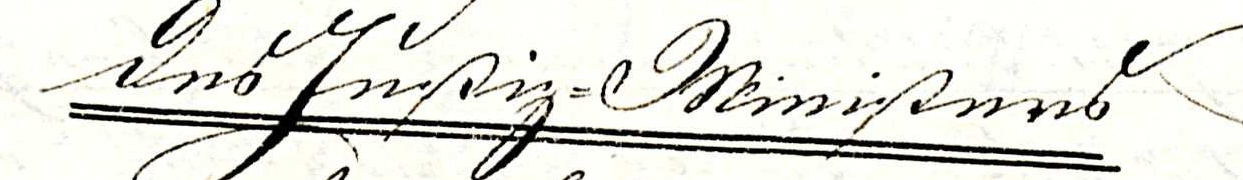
des Justiz=Ministers
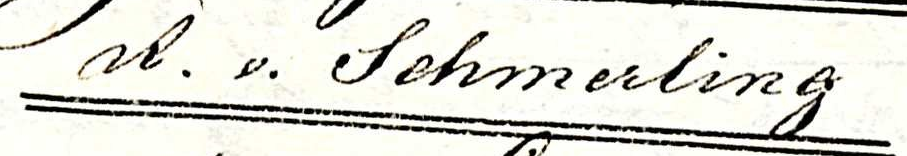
R. v. Schmerling
